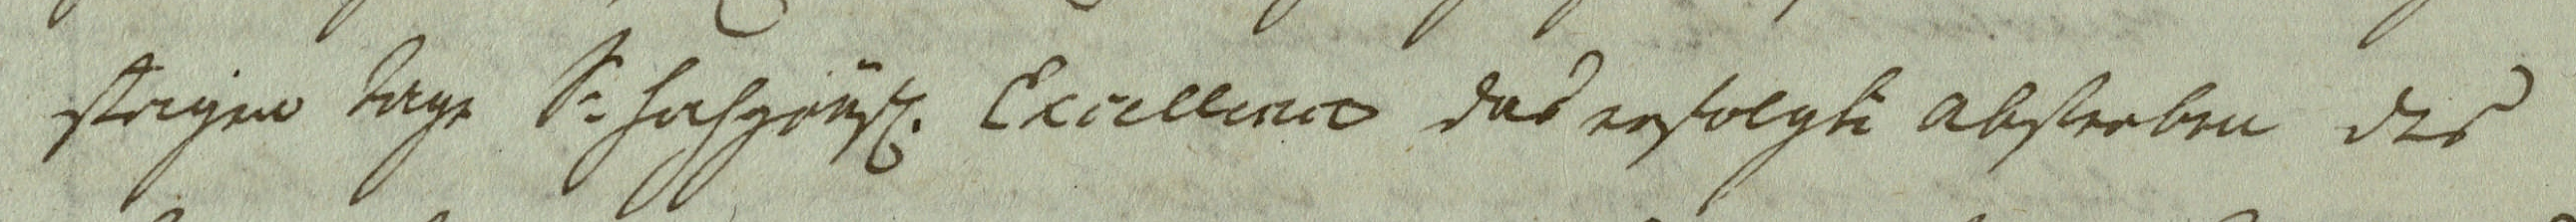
strigen Tage Sr. hochgräfl. Excellence das erfolgte Absterben des
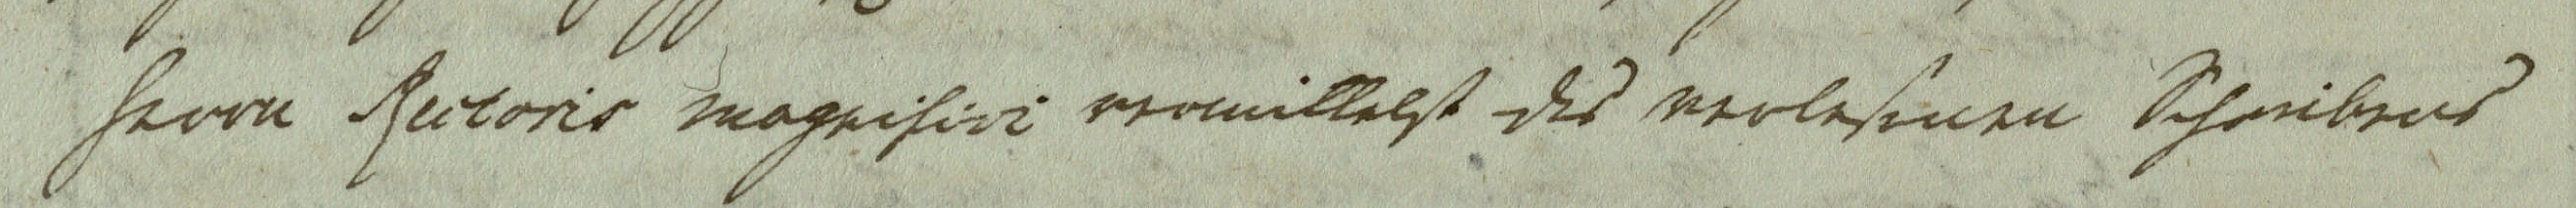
herrn Rectoris Magnifici vermittelst des verlesenen Schreibens
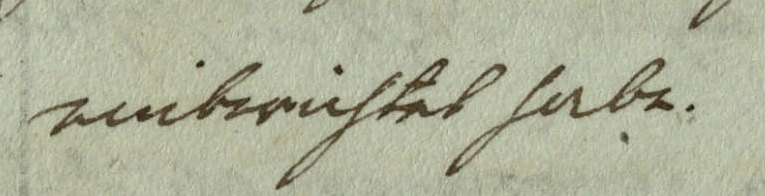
einberichtet habe.
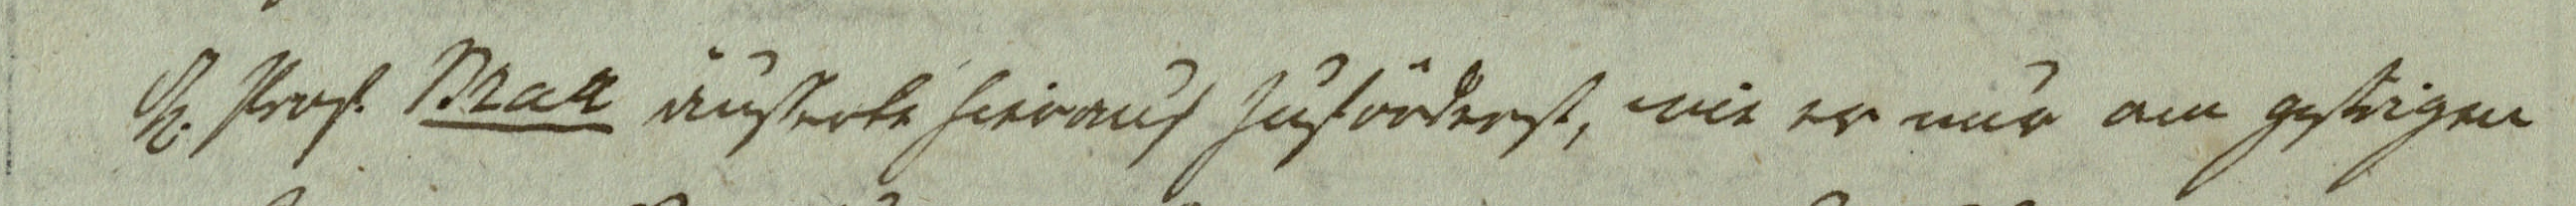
dh. Prof. Bratt äusserte hierauf zuförderst, wie er nur am gestrigen
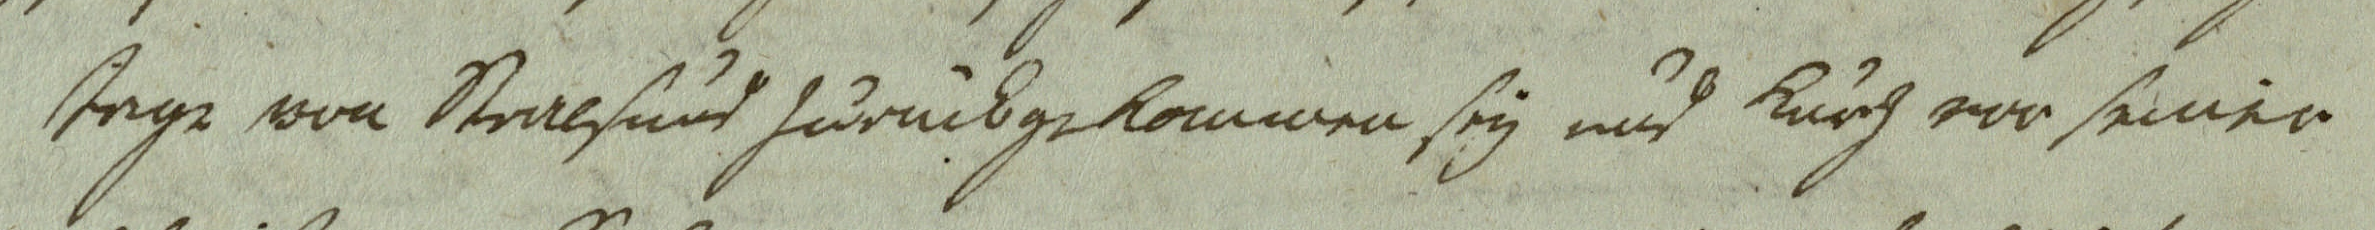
Tage von Stralsund zurückgekommen seÿ und kurz vor seiner
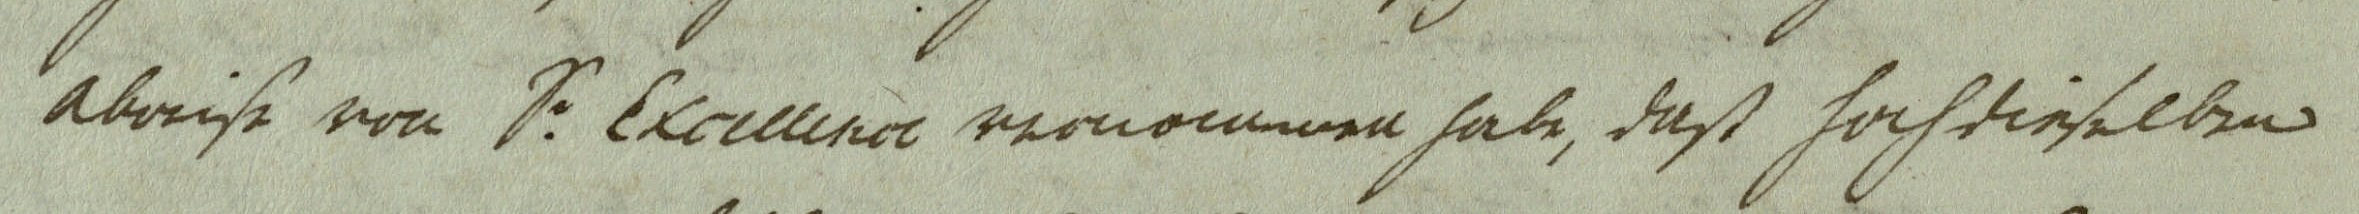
Abreise von Sr. Excellence vernommen habe, daß hochdieselben
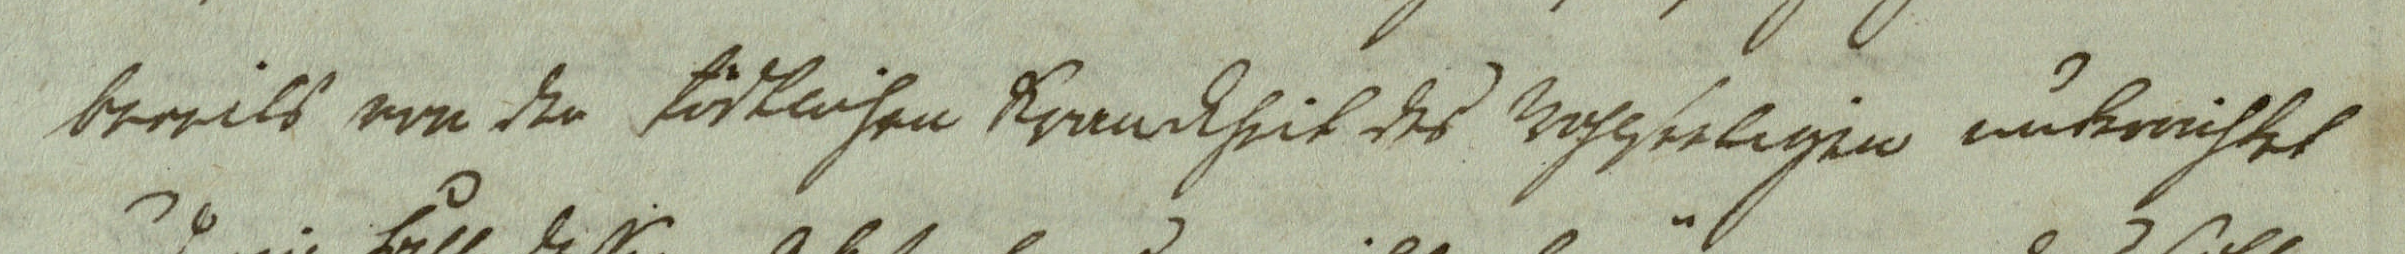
bereits von der tödtlichen Kranckheit des Wohlseeligen unterrichtet
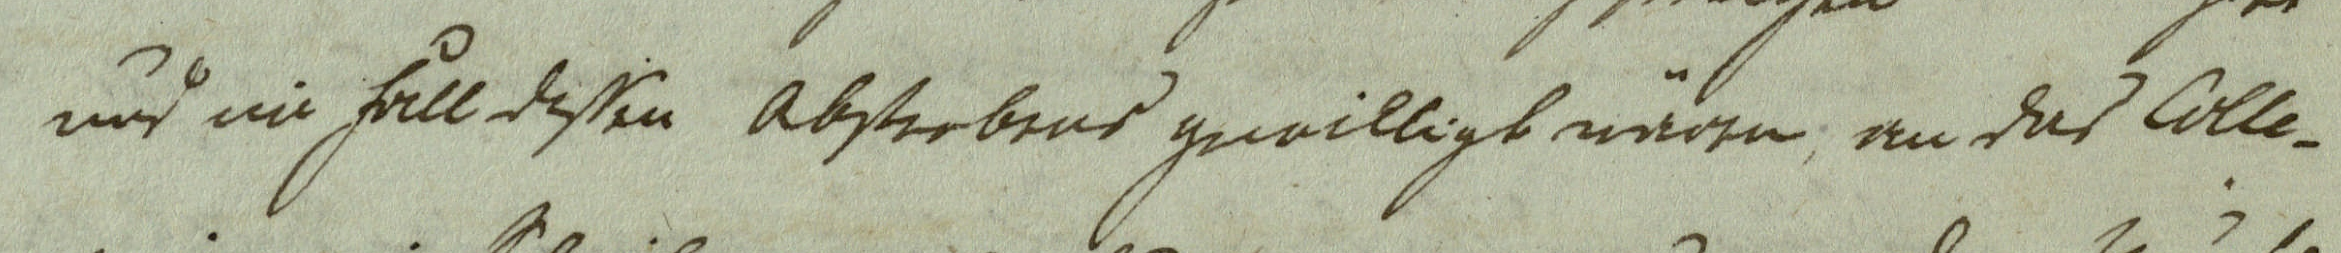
und im Fall dessen Absterbens gewilligt wären, an das Colle¬
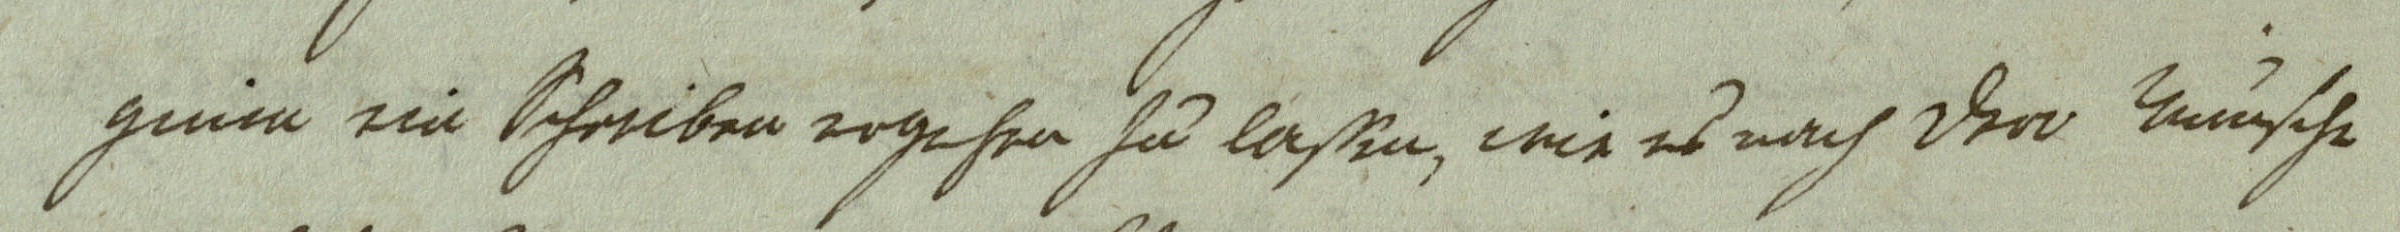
gium ein Schreiben ergehen zu lassen, wie es nach dero Wunsche
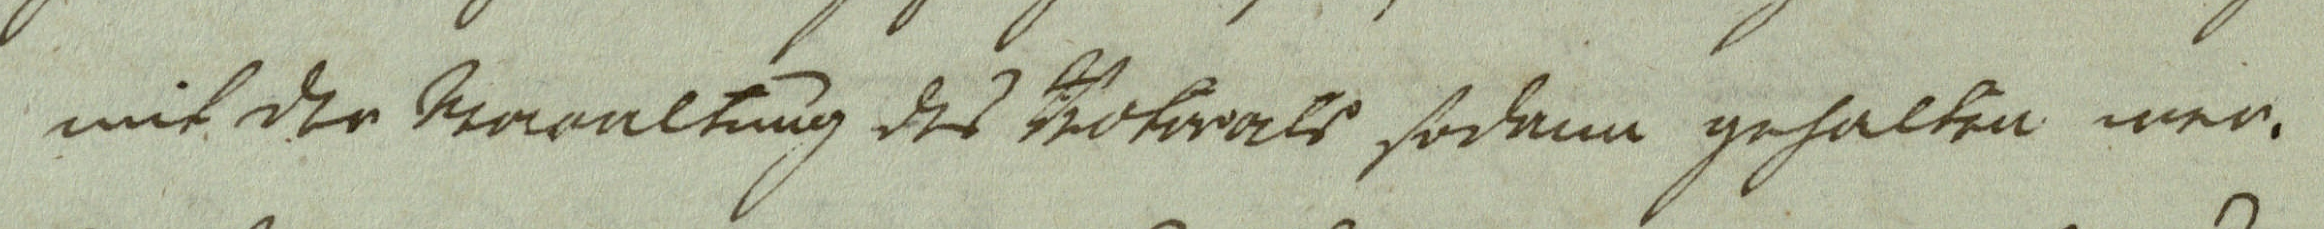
mit der Verwaltung des Rectorats sodann gehalten wer¬
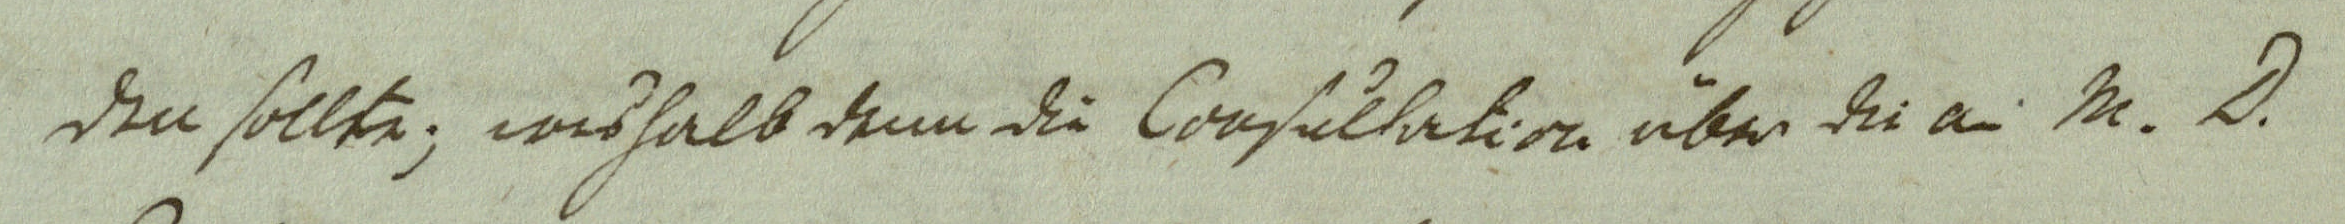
den sollte; weshalb denn die Consultation über die a M. D.
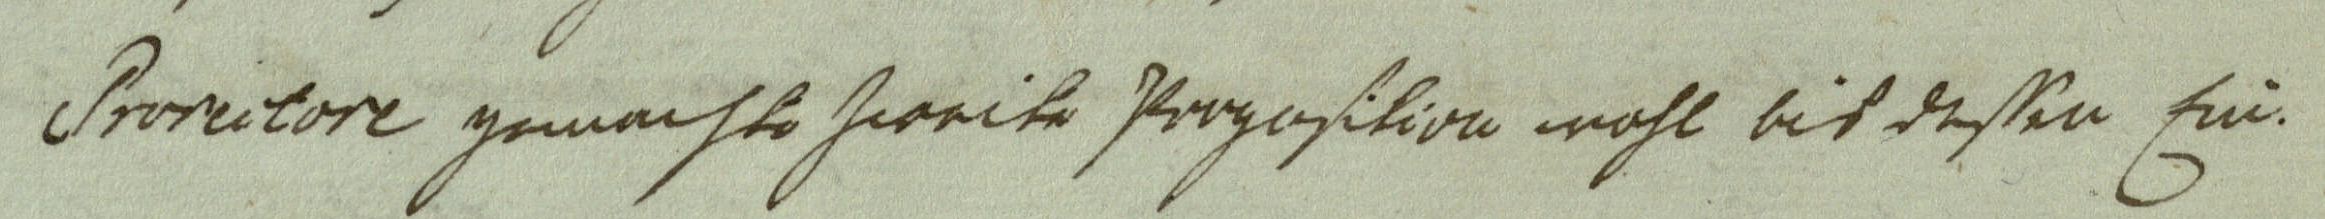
Prorectore gemachte zweite Proposition wohl bis dessen Ein¬
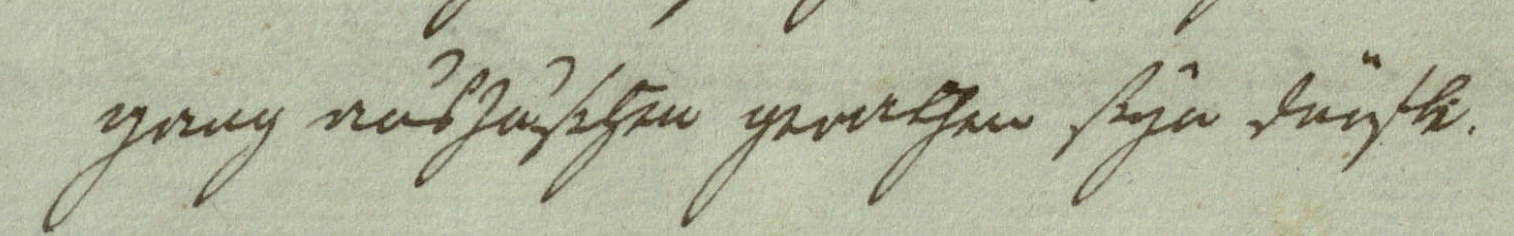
gang auszusetzen gerathen seÿn dürfte.
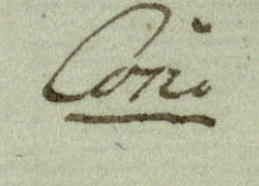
Con
